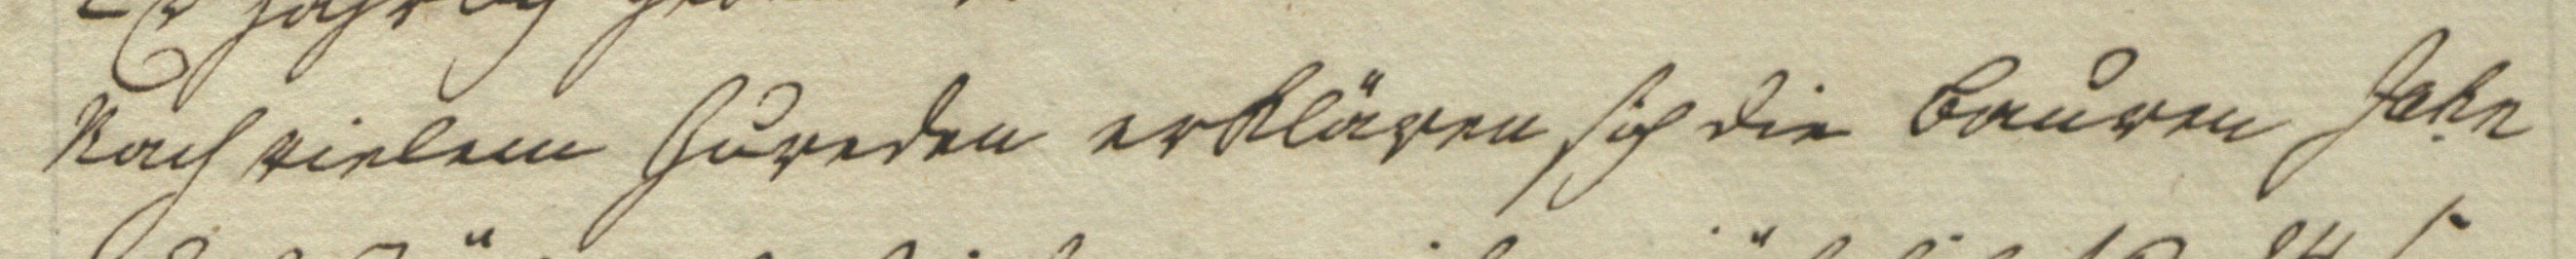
Nach viele Zureden erklären sich die Bauren Jahn
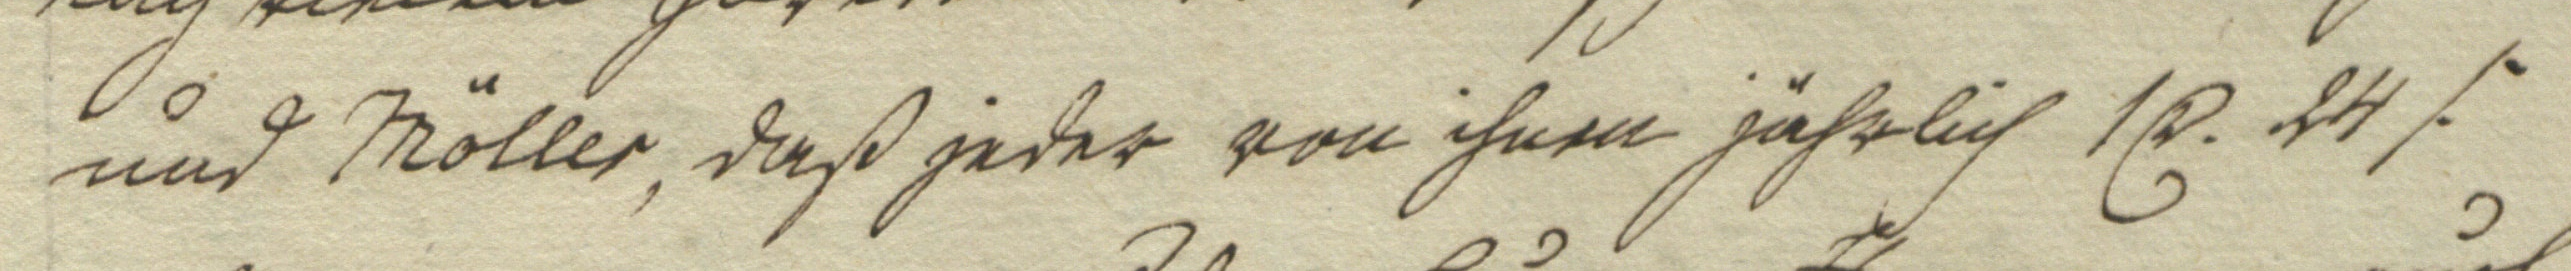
und Möller, daß jeder von ihnen jährlich 1 l. 24 s.
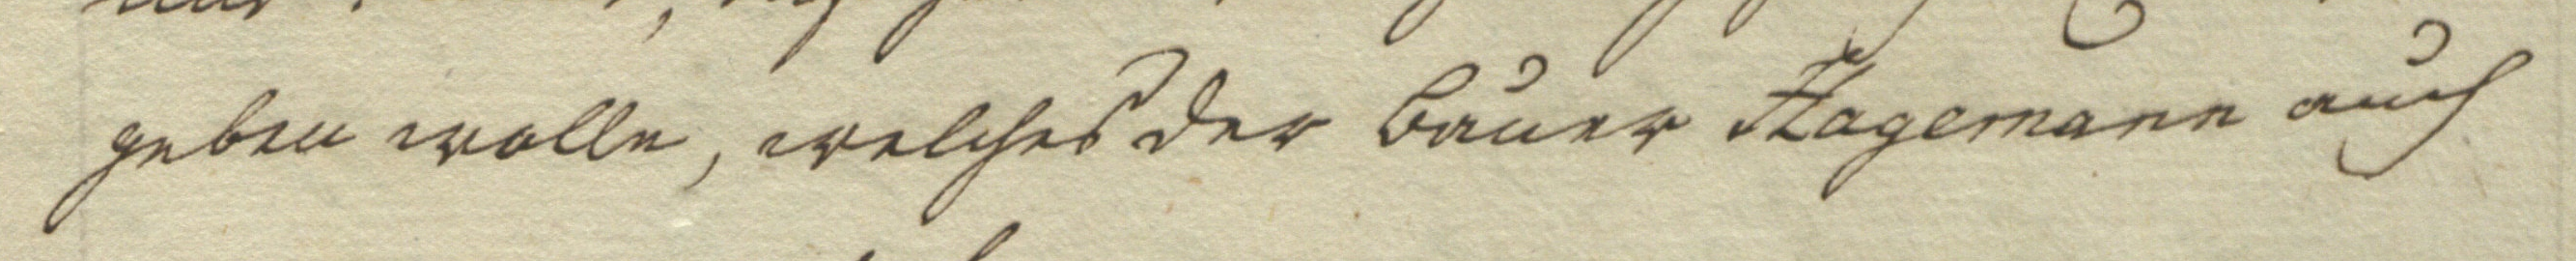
geben wolle, welches der Bauer Hagemann auch
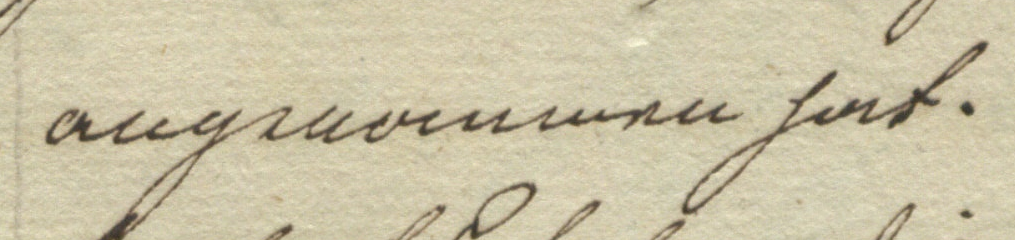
angenommen hat.
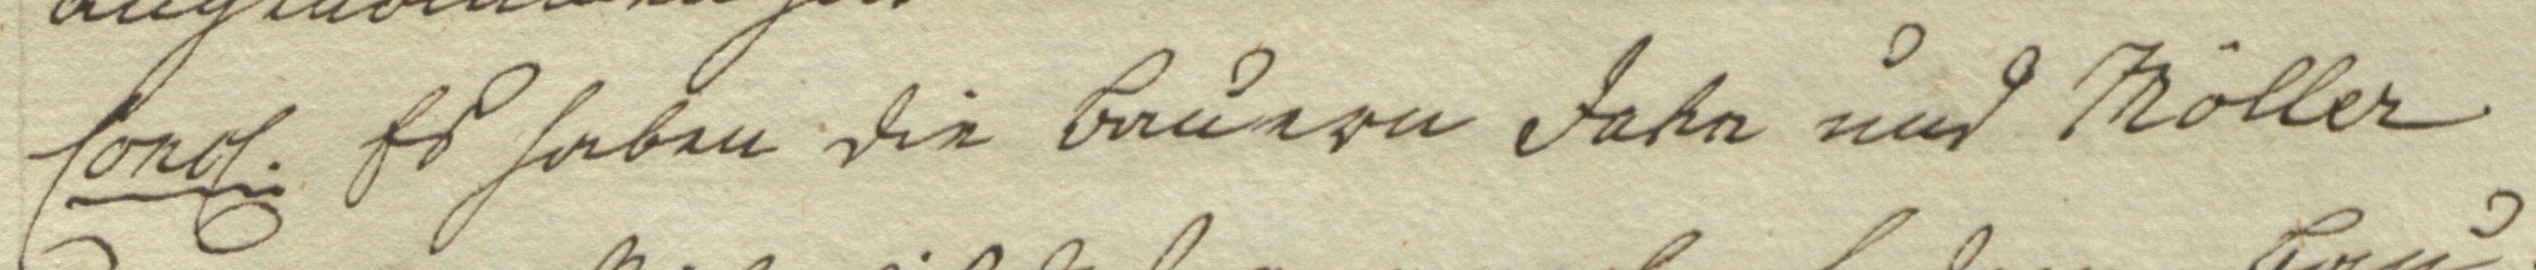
Concl. Es haben die Bauern Jahn und Möller
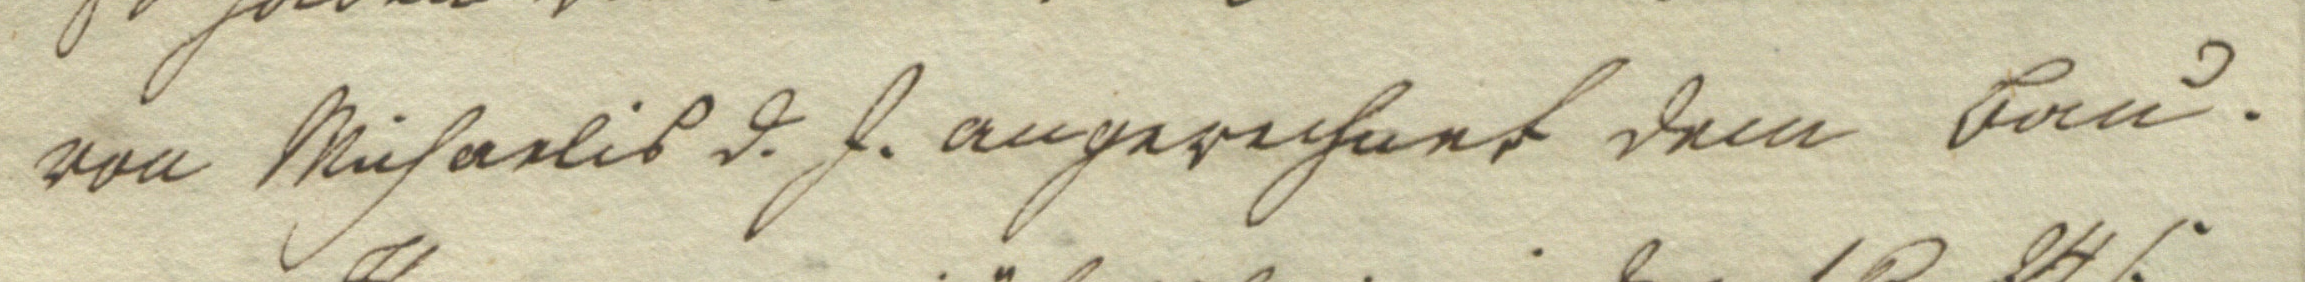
von Michaelis d. J. angerechnet dem Bau¬
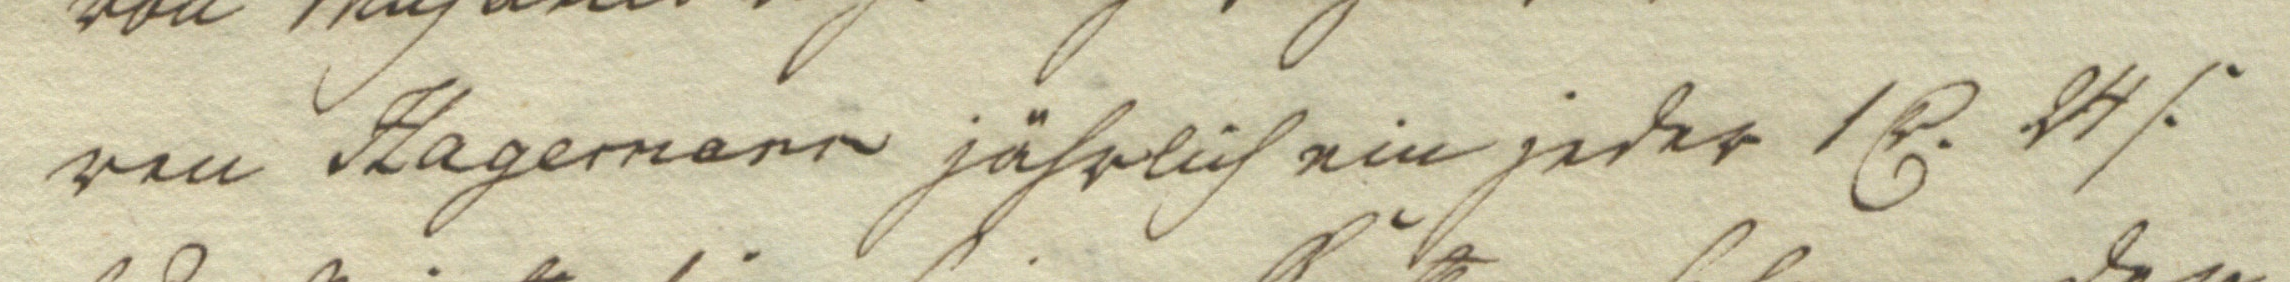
ren Hagemann jährlich ein jeder 1 l. 24 s.
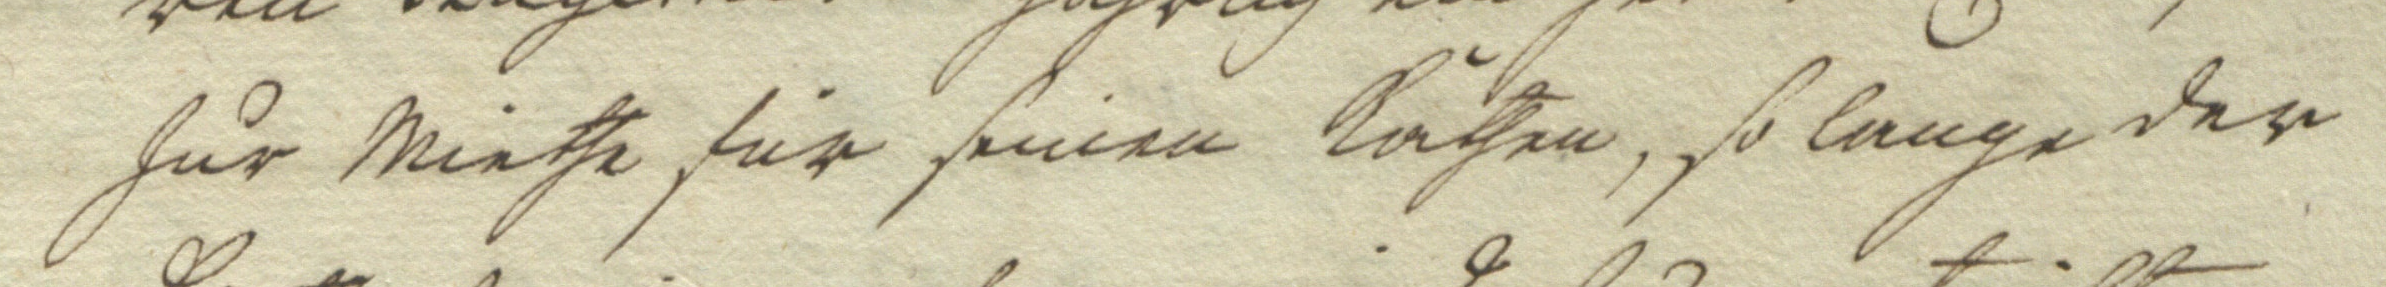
zur Miethe für seinen Kathen, so lange der
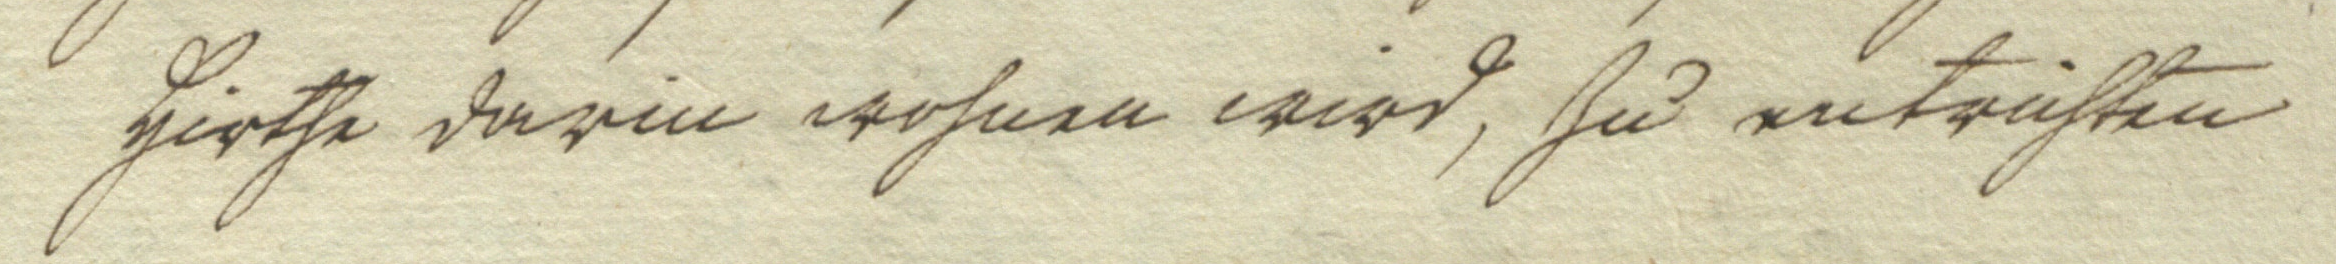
Hirthe darin wohnen wird, zu entrichten
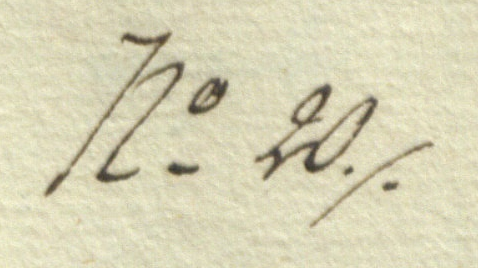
No 20.
